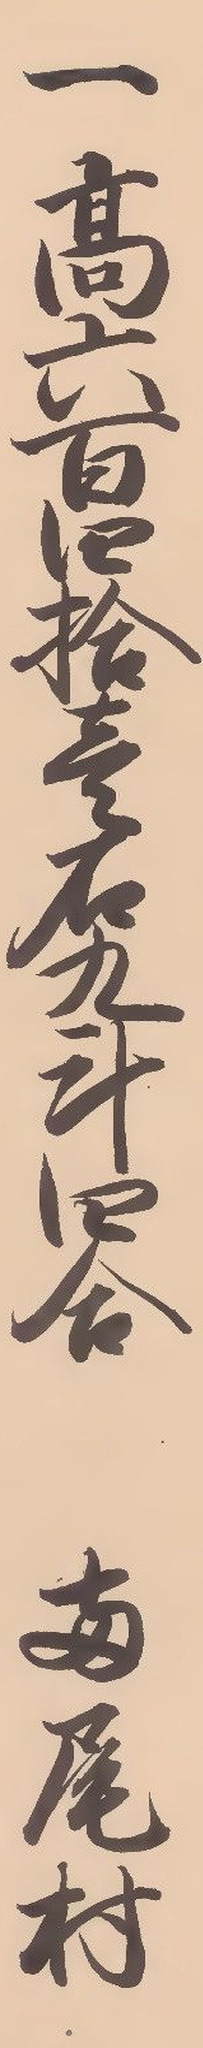一高六百四拾壱石九斗四合両尾村
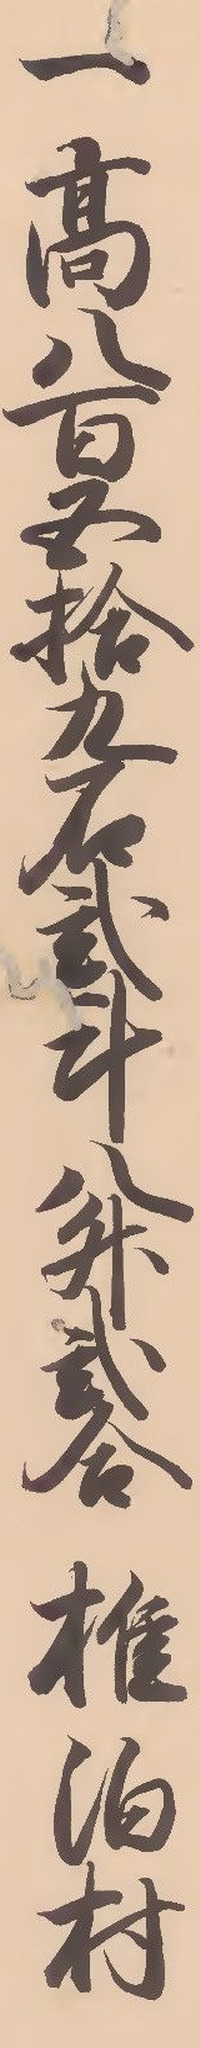一高八百五拾九石弐斗八升弐合椎泊村

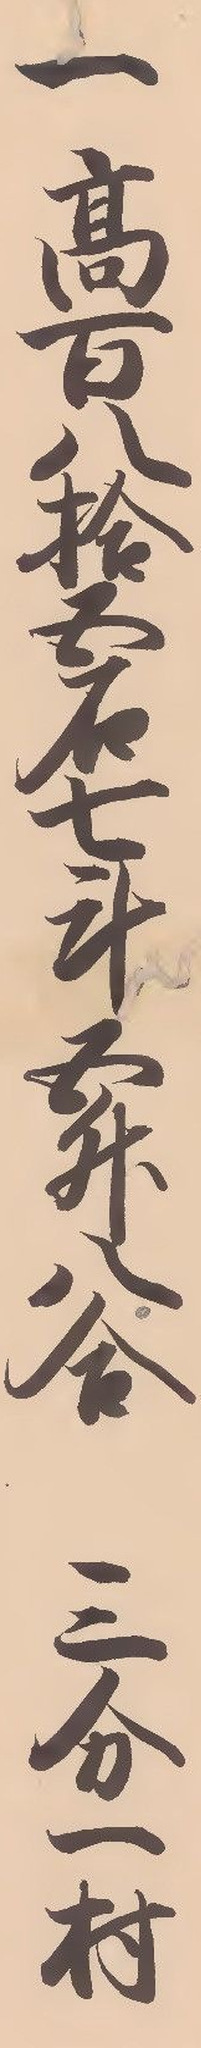一高百八拾五石七斗五升八合三分一村
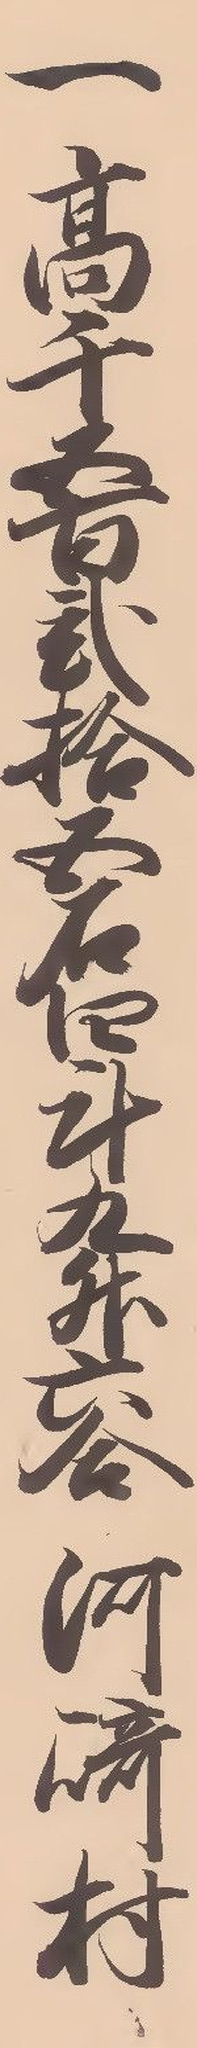一高千五百弐拾五石四斗九升六合河崎村
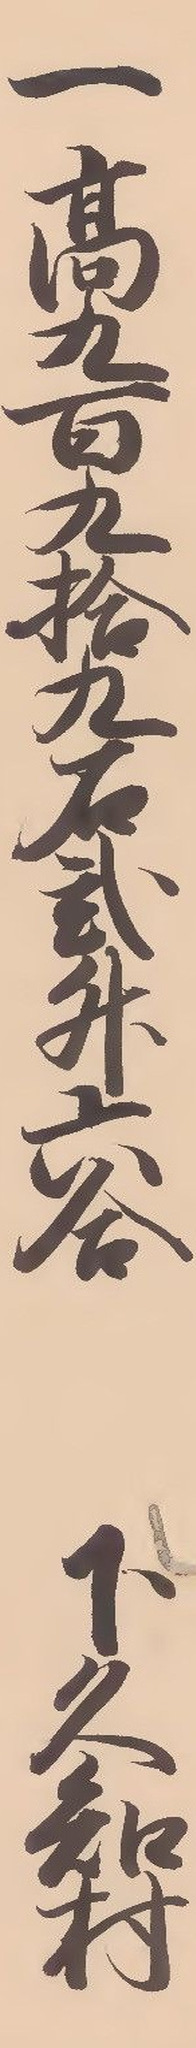一高九百九拾九石弐升六合下久知村
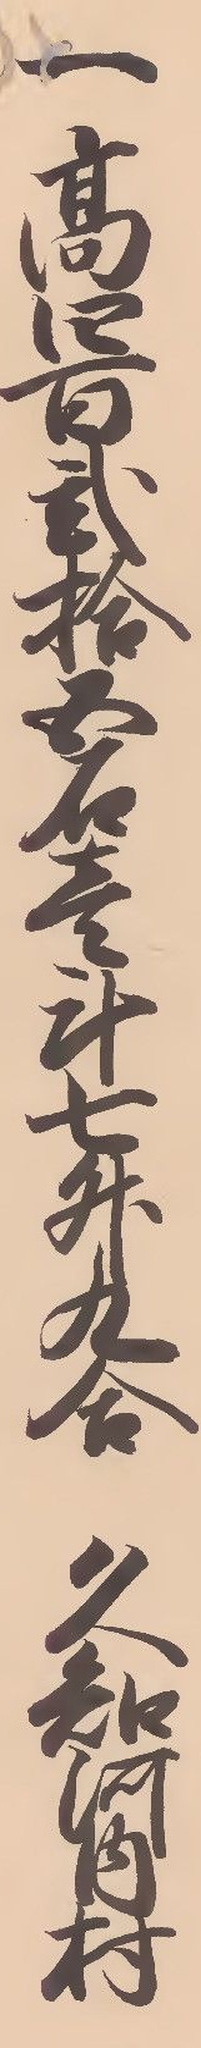一高四百弐拾五石壱斗七升九合久知河内村
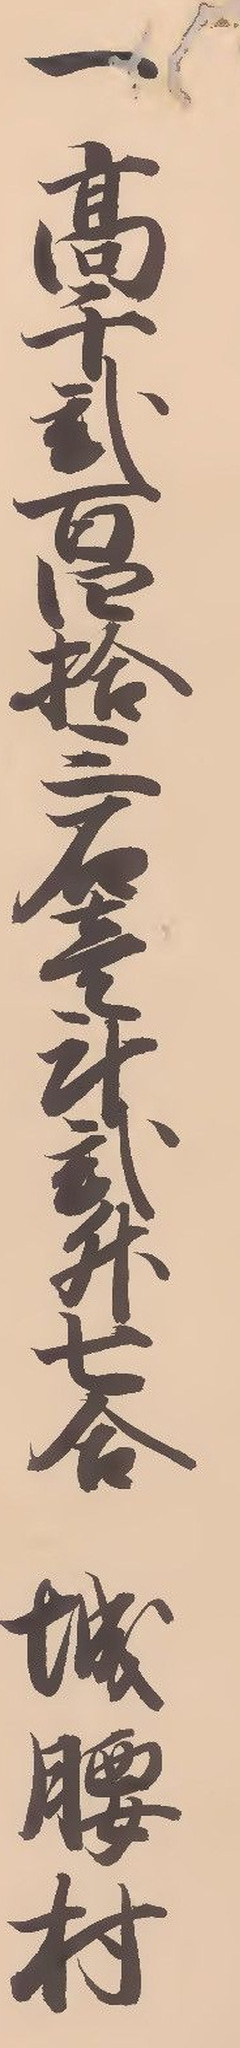一高千弐百四拾三石壱斗弐升七合城腰村
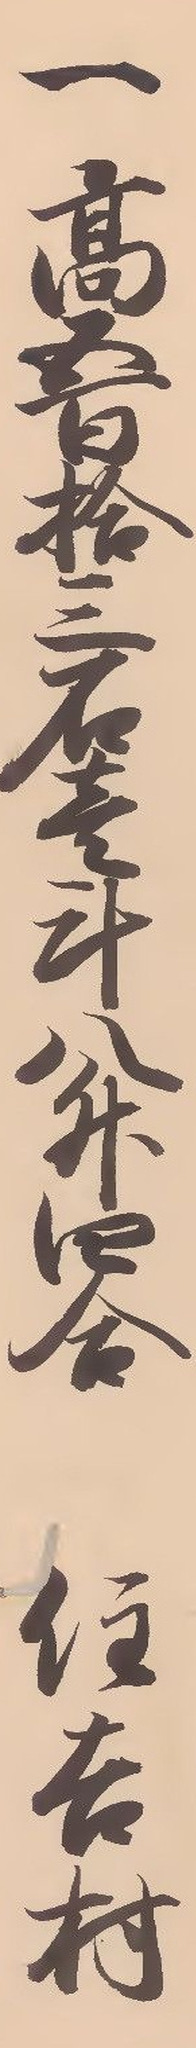一高五百拾三石壱斗八升四合住吉村
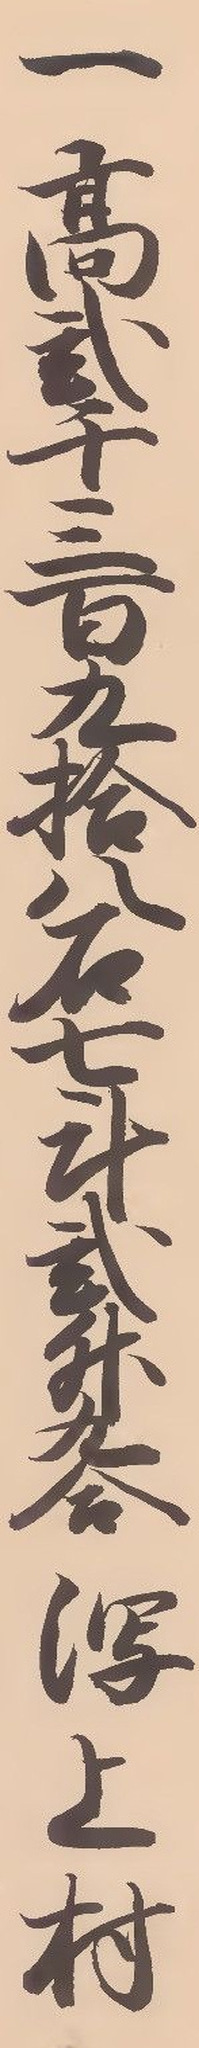一高弐千三百九拾八石七斗弐升九合潟上村
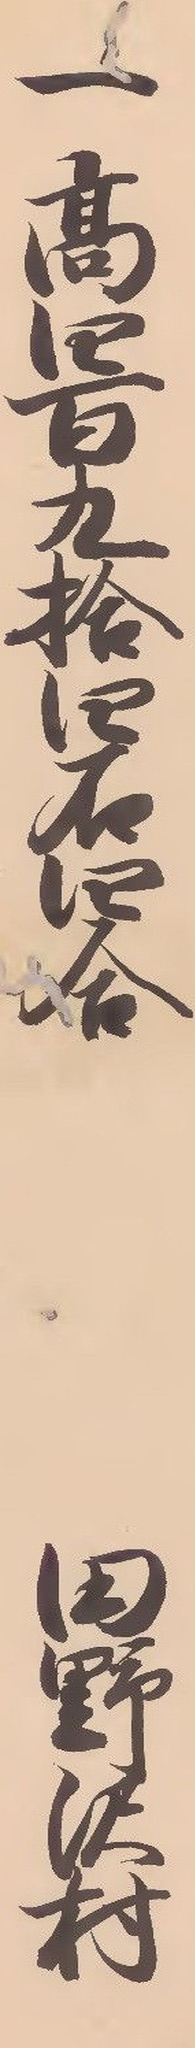一高四百九拾四石四合田野沢村

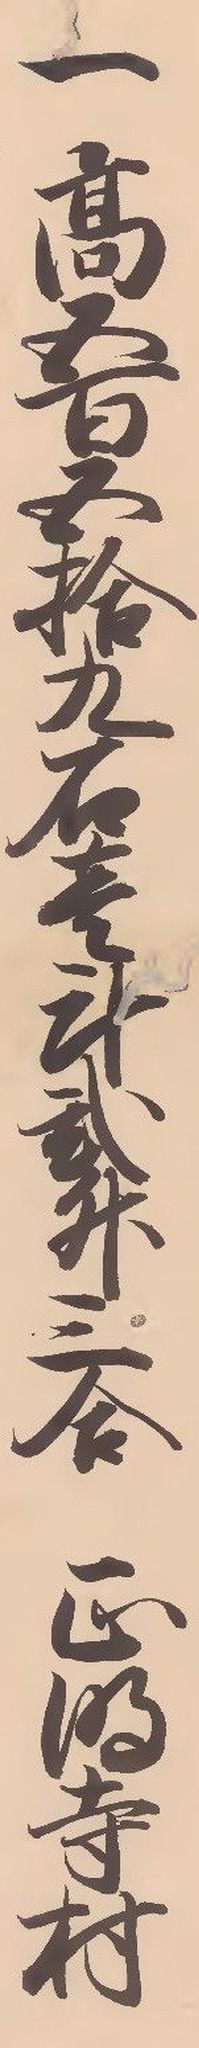一高五百五拾九石壱斗弐升三合正明寺村
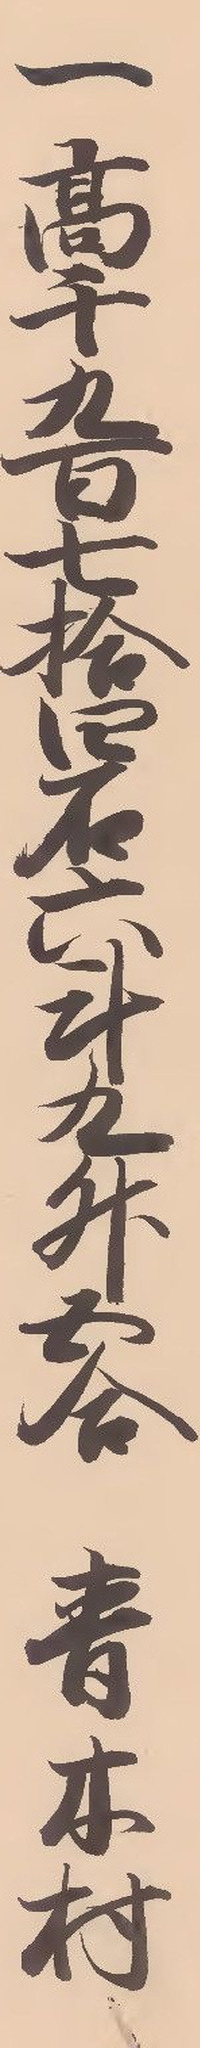一高千九百七拾四石六斗九升五合青木村
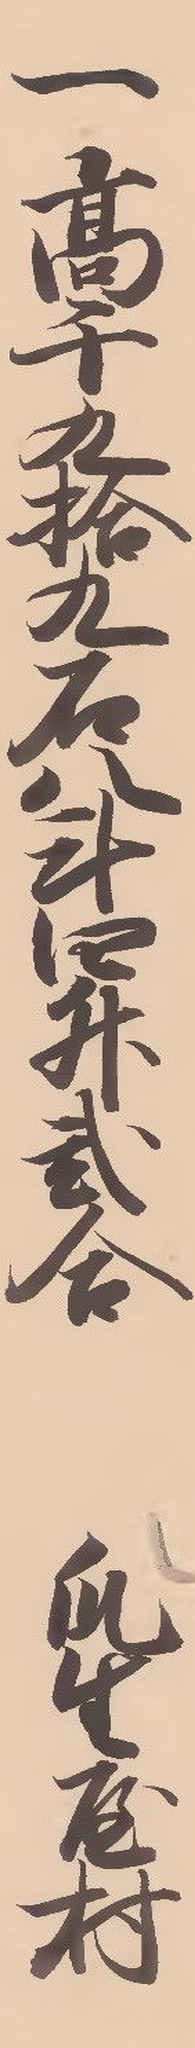一高千九拾九石八斗四升弐合瓜生屋村
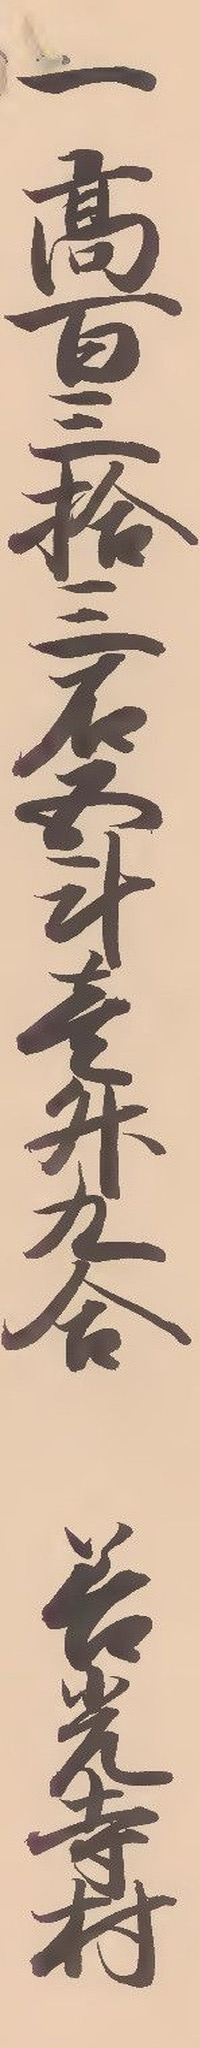一高百三拾三石五斗壱升九合善光寺村
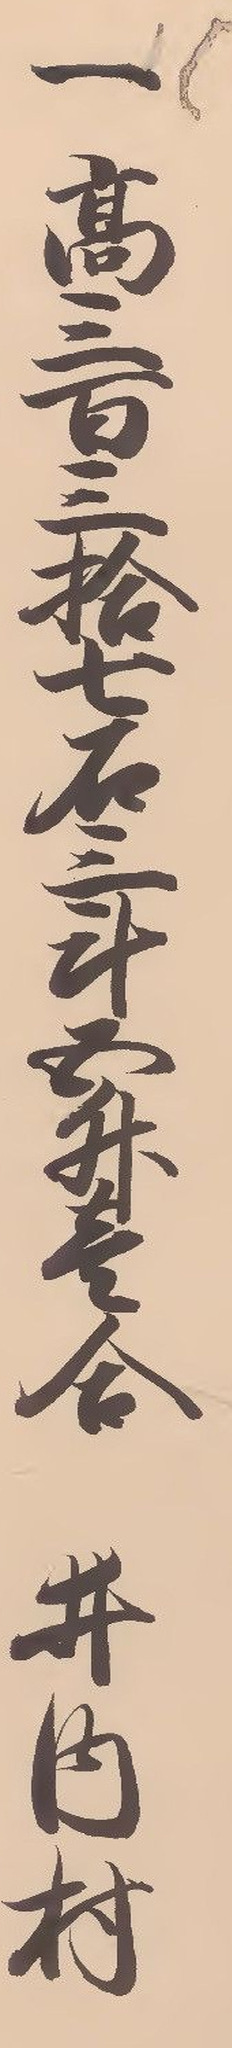一高三百三拾七石三斗五升壱合井内村
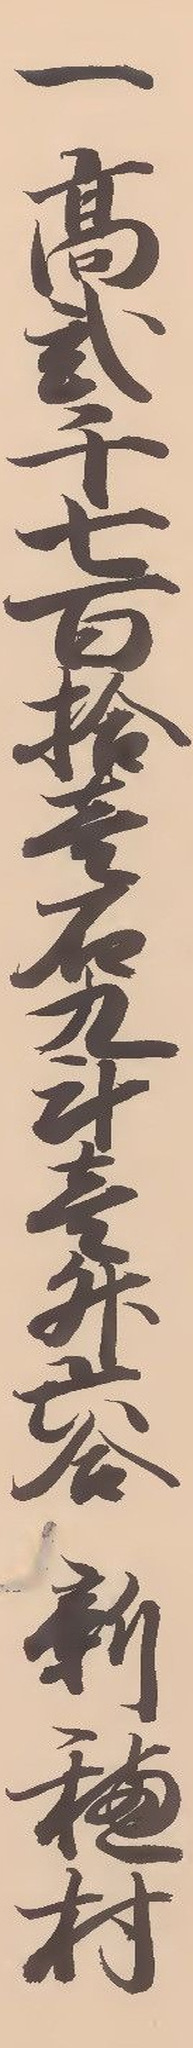一高弐千七百拾壱石九斗壱升六合新穂村
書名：佐渡国郷帳
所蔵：国立公文書館 National Archives of Japan
